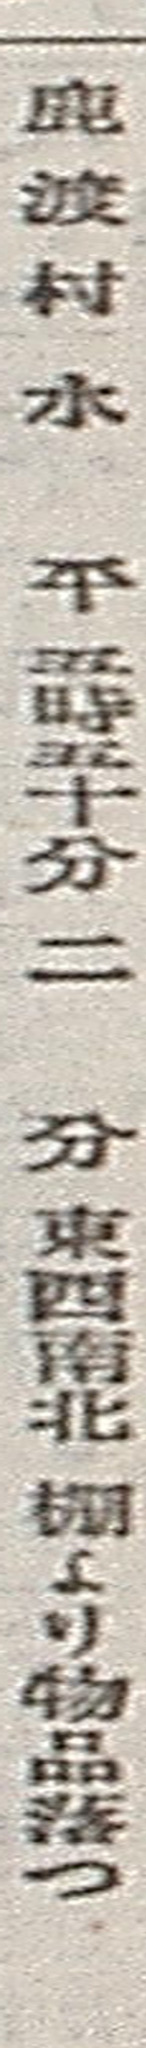鹿渡村水平五時五十分二分東西南北棚より物品落つ
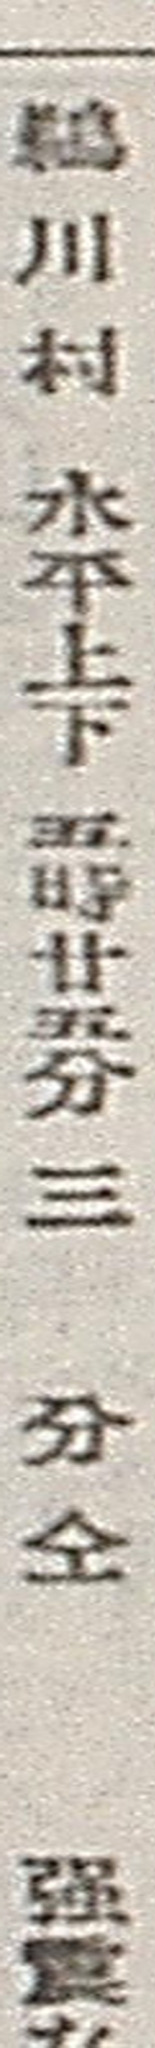鵜川村水平上下五時廿五分三分仝強震なり
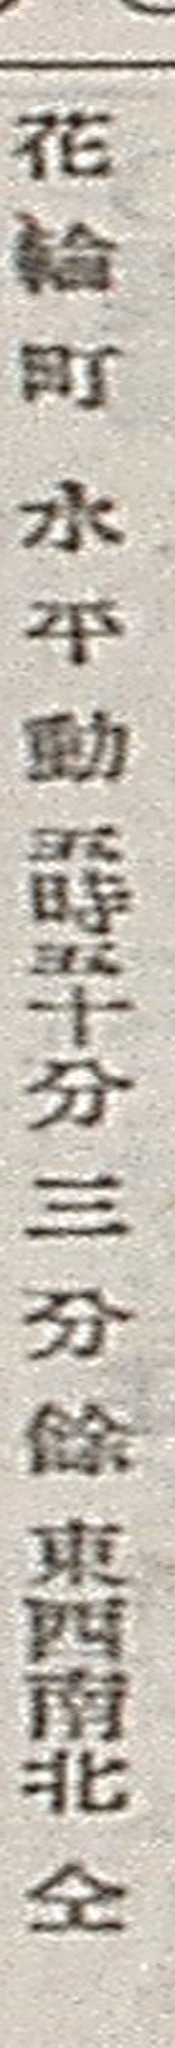花輪町水平動五時十分三分余東西南北仝
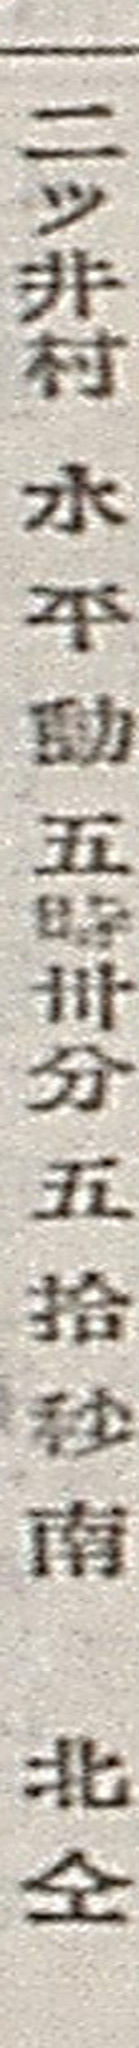二ツ井村水平動五時卅分五拾秒南北仝
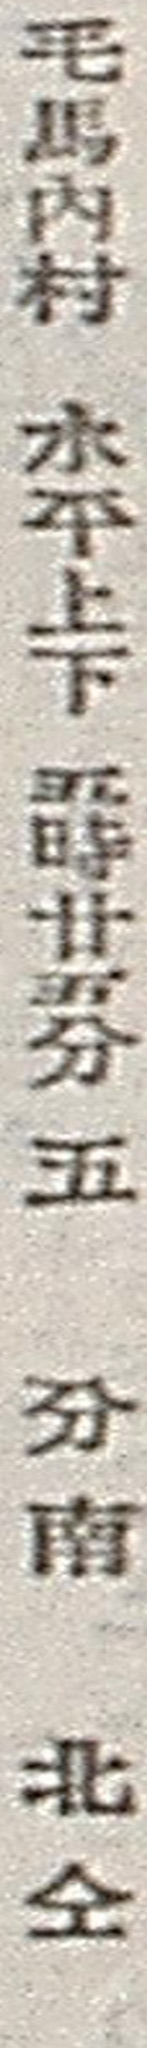毛馬内村水平上下五時廿五分五分南北仝
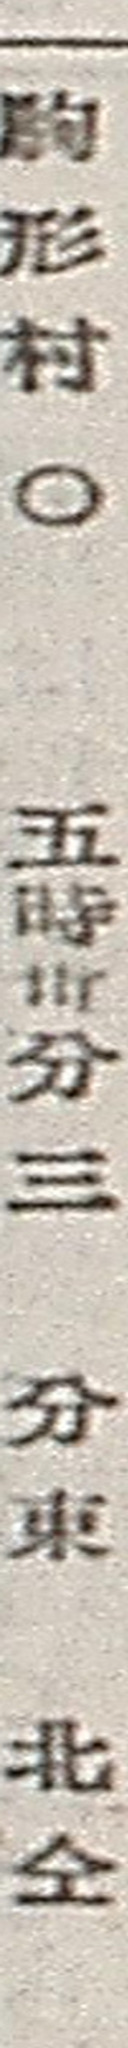駒形村〇五時卅分三分東北仝
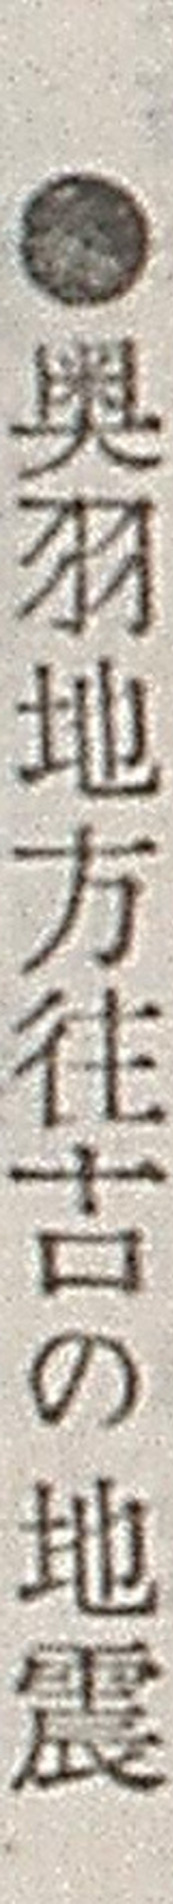●奥羽地方往古の地震
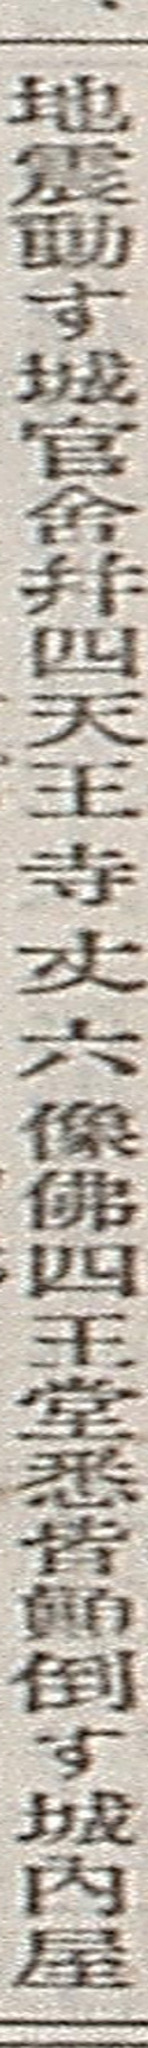地震動す城官舎幷四天王寺丈六像仏四王堂悉皆顚倒す城内屋
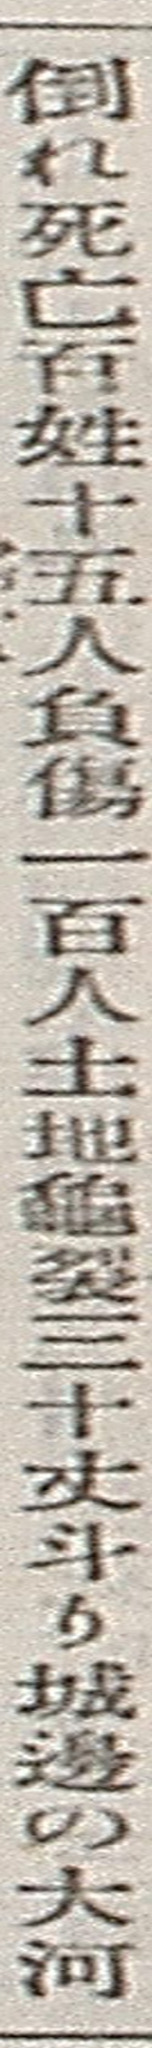倒れ死亡百姓十五人負傷一百人土地亀裂三十丈斗り城辺の大河
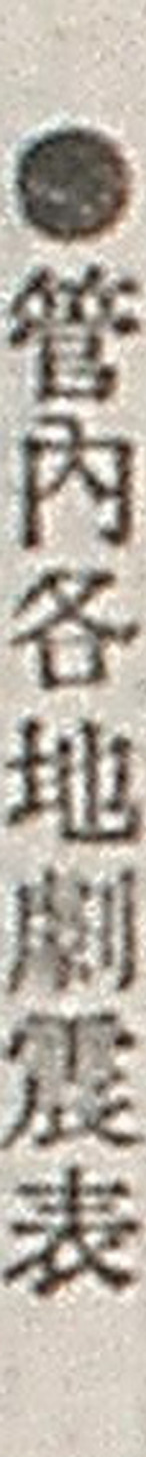●管内各地劇震表
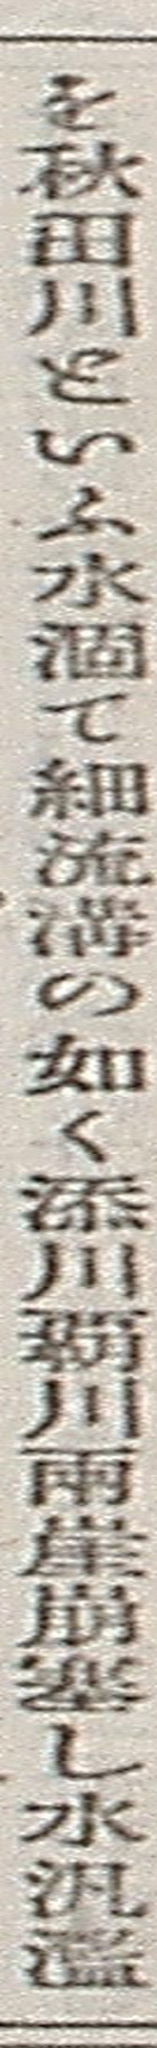を秋田川といふ水涸て細流溝の如く添川覇川両崖崩塞し水汎濫
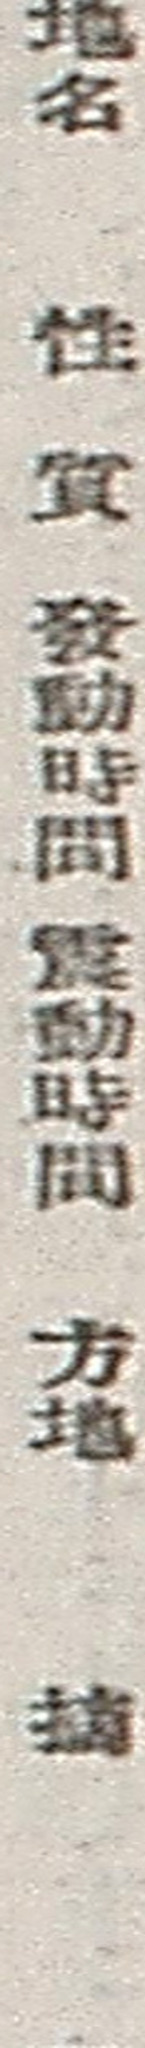地名性質発動時間震動時間方地摘要
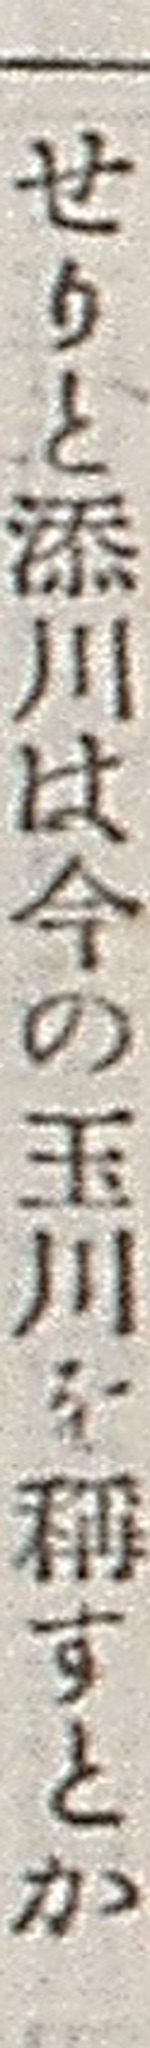せりと添川は今の玉川を称すとか
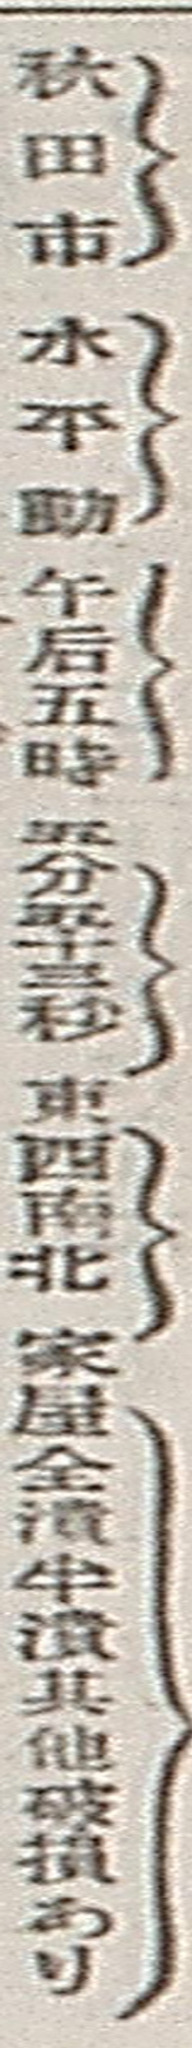秋田市水平動午后五時五分五十三秒東西南北家屋全潰半潰其他破損あり
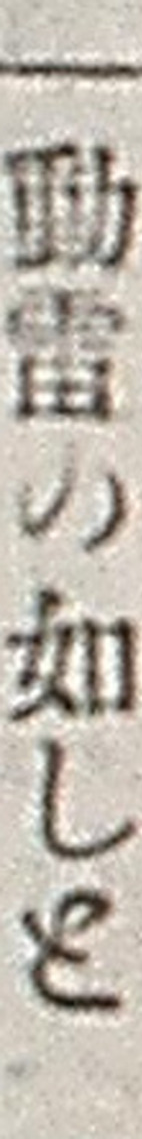動雷の如しと

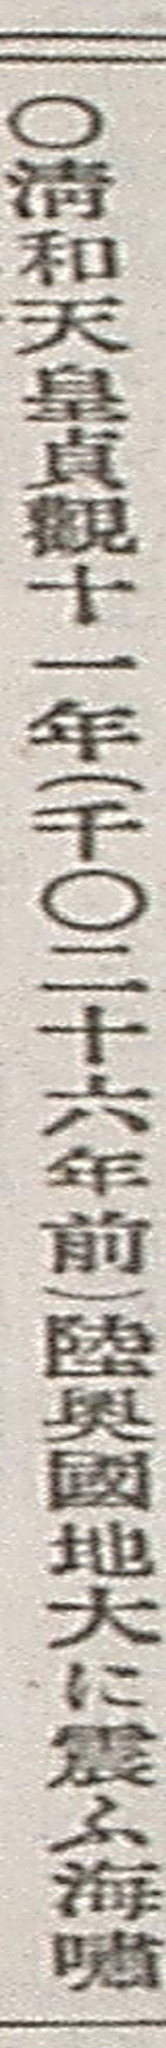〇清和天皇貞観十一年陸奥国地大に震ふ海嘯
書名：風俗畫報臨時増刊第百二十四號　洪水地震被害録（上）
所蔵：東京大学地震研究所図書室 Earthquake Research Institute Library, The University of Tokyo, JAPAN
